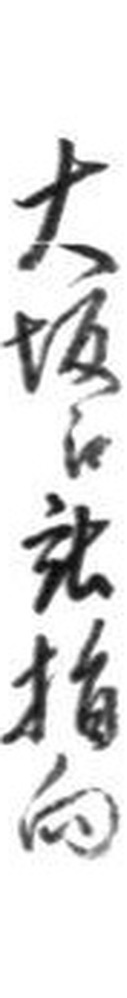大坂江被指向
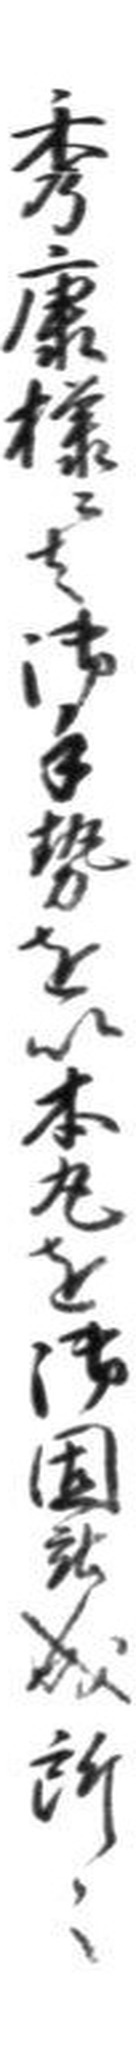秀康様ニ者御手勢を以本丸を御固被成所々
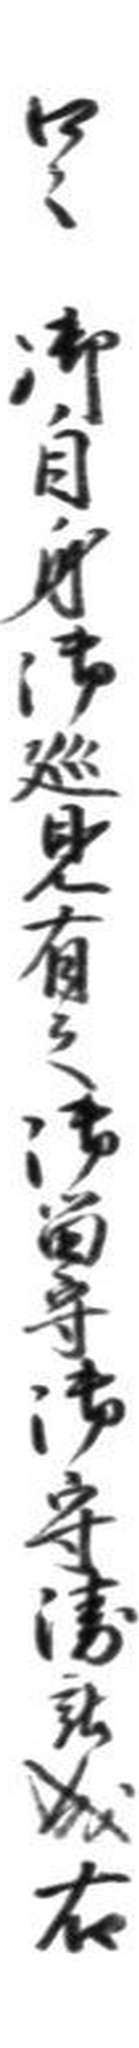口々御自身御巡見有之御留守御守衛被成右
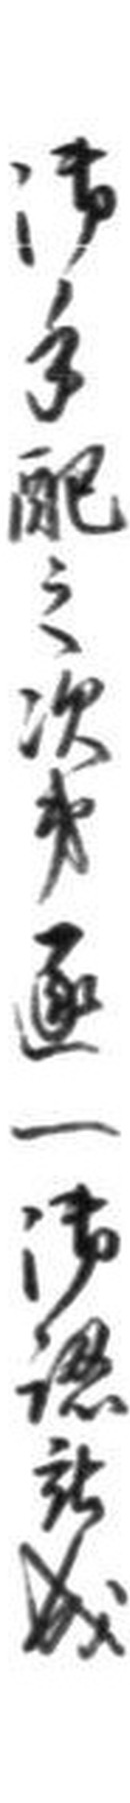御手配之次第逐一御認被成
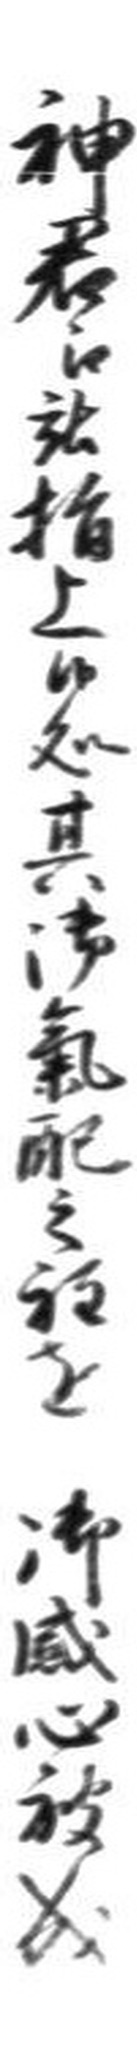神君江被指上候処其御気配之程を御感心被成
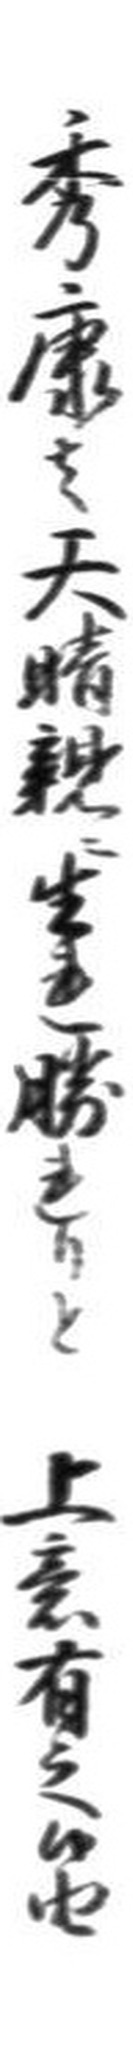秀康者天晴親ニ生れ勝れりと上意有之候由
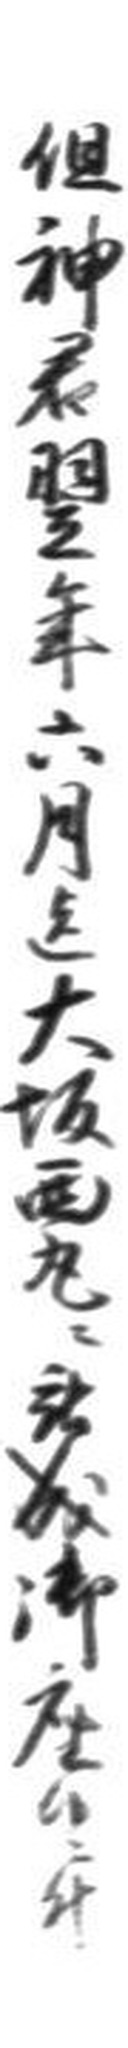但神君翌年六月迄大坂西丸ニ被成御座候ニ付
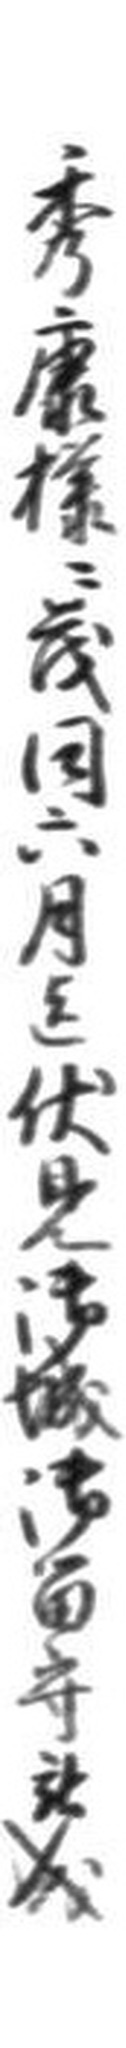秀康様ニも同六月迄伏見御城御留守被成
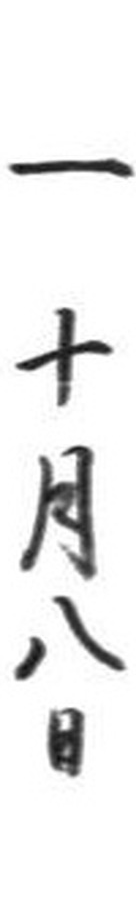一十月八日
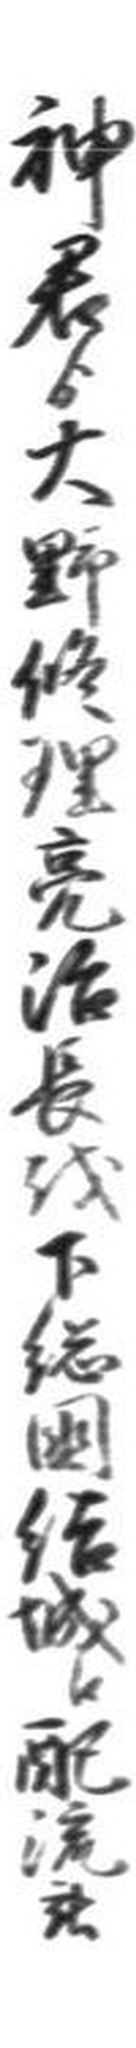神君ゟ大野修理亮治長を下総国結城江配流被
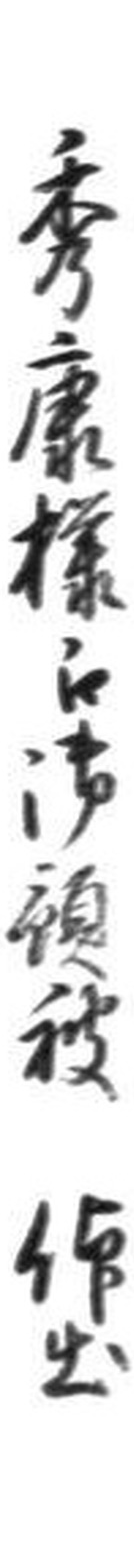秀康様江御預被仰出
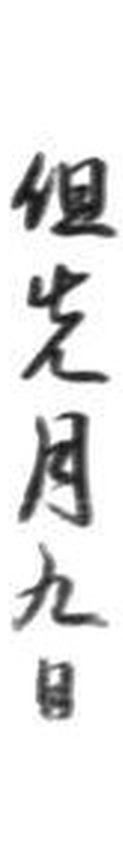但先月九日

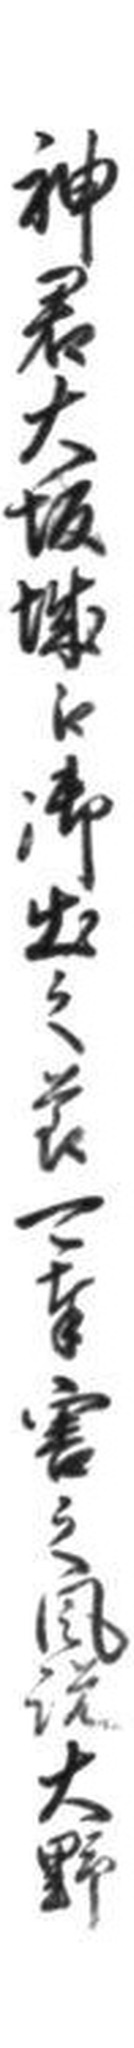神君大坂城江御出之節可奉害之風説大野
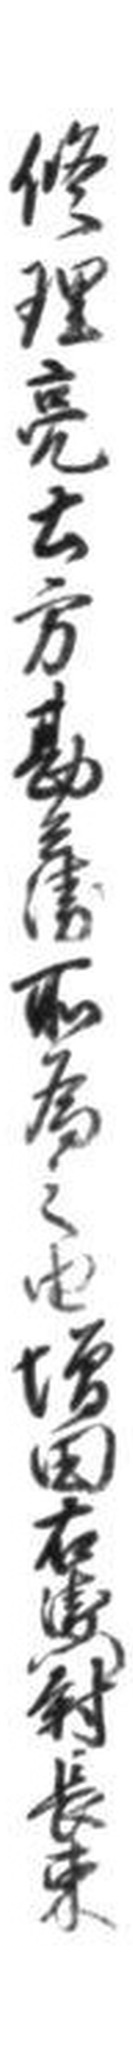修理亮土方勘兵衛所為之由増田右衛門尉長束
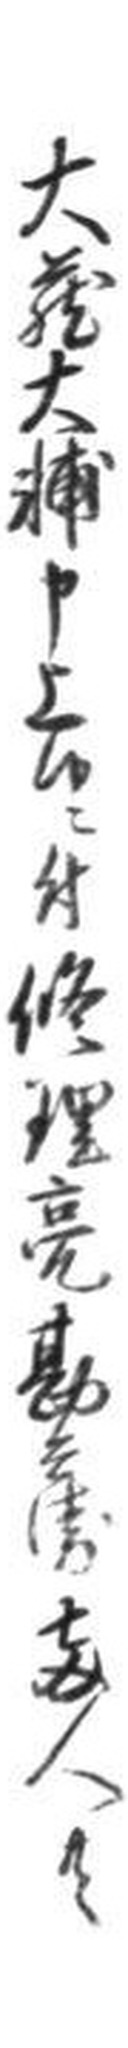大蔵大輔申上候ニ付修理亮勘兵衛両人共
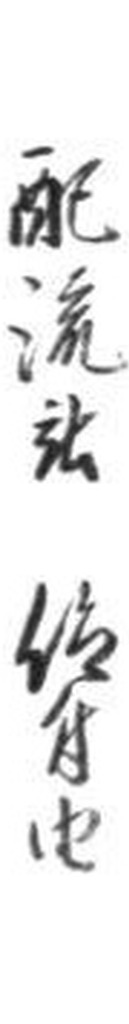配流被仰付由
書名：家譜 一 秀康公 従天正二年到慶長十二年
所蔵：福井県文書館 Fukui Prefectural Archives
